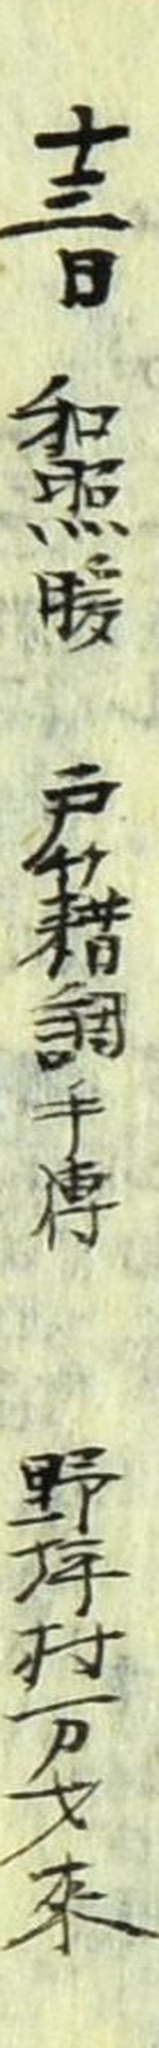十三日和照暖戸籍調手伝野坪村万才来
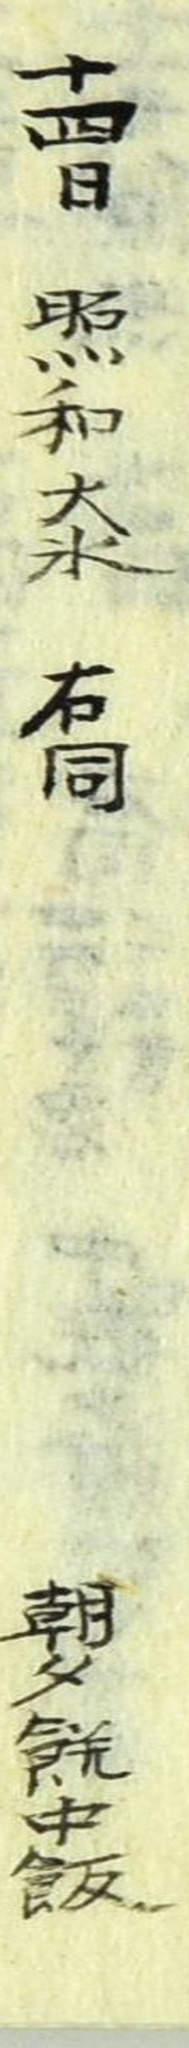十四日照和大氷右同朝夕餅中飯
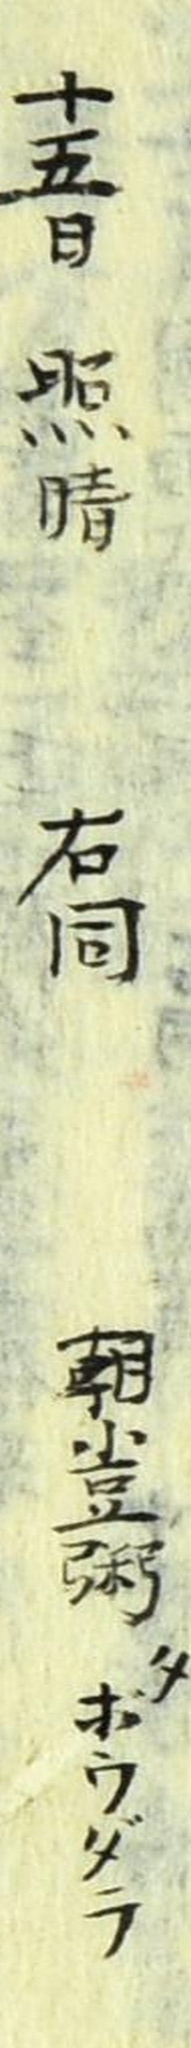○十五日照晴右同朝小豆粥夕ボウダラ
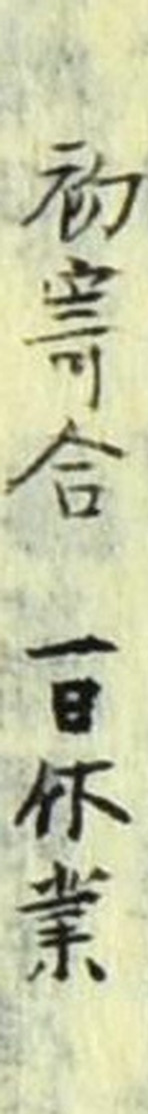初寄合一日休業

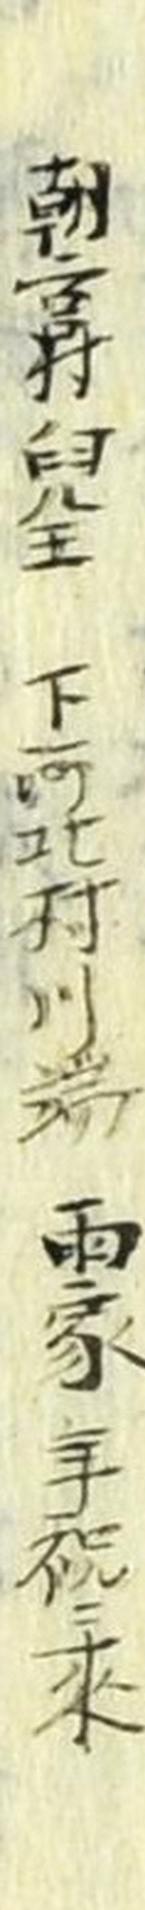朝宮村児玉下河北村川端両家年祝ニ来
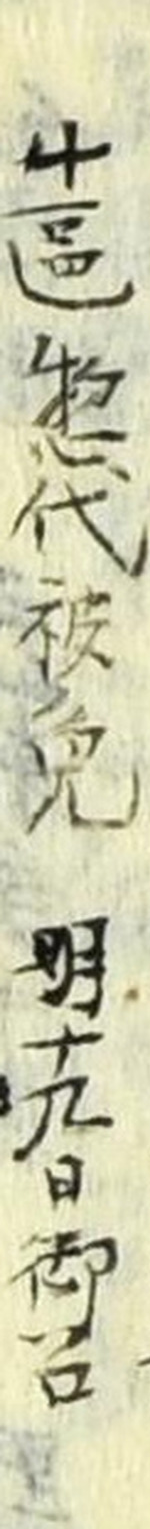十区惣代被免明十九日御召
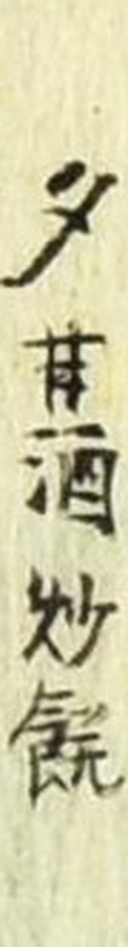夕甘酒炒餅

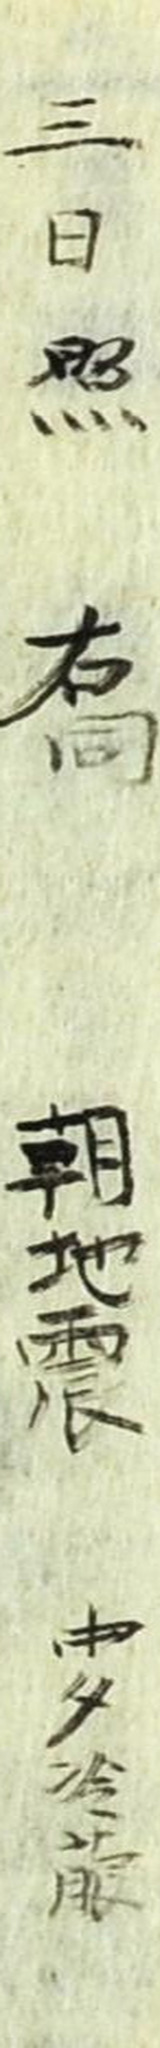三日照右同朝地震中夕冷菔
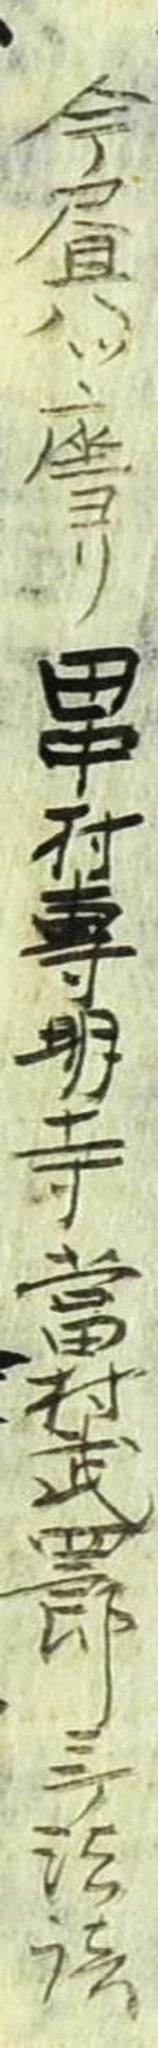今昼八ツ座ヨリ田中村専明寺当村武四郎ニテ法談
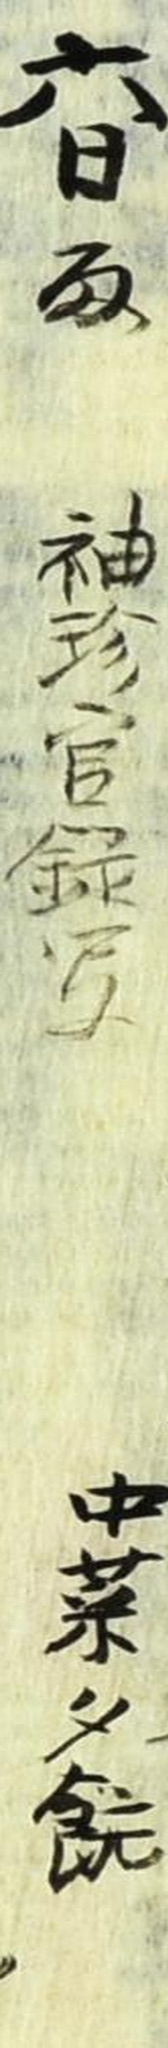六日雨袖珍官録写中名夕餅
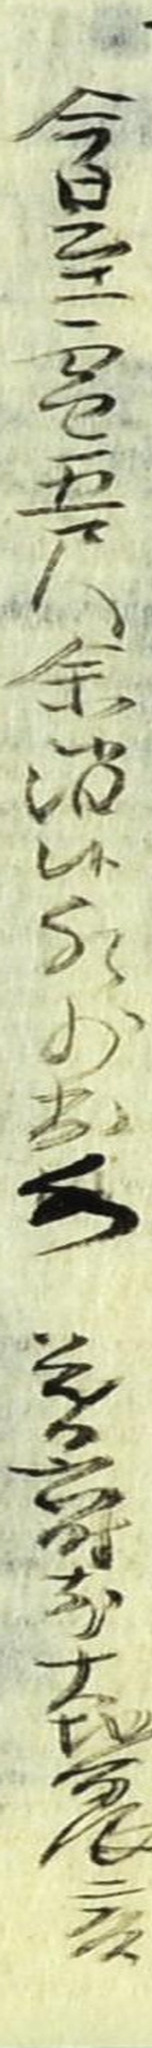今日至雪五尺余消候水少出水暮六時前大地震二度
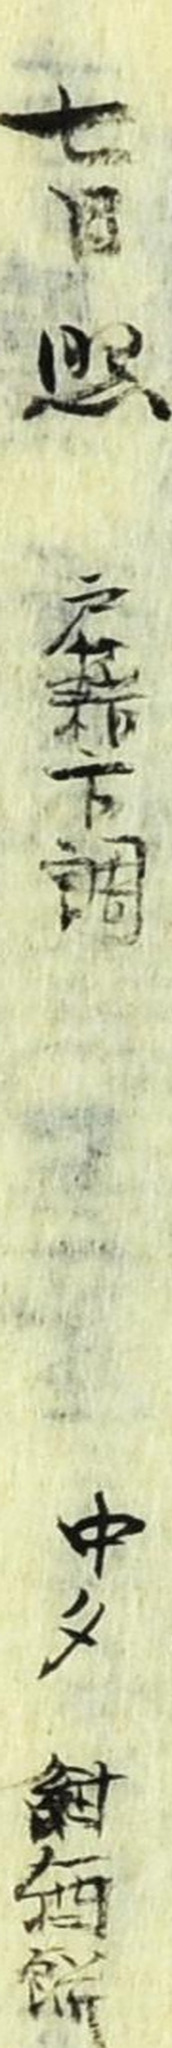七日照戸籍下調中夕甘酒餅
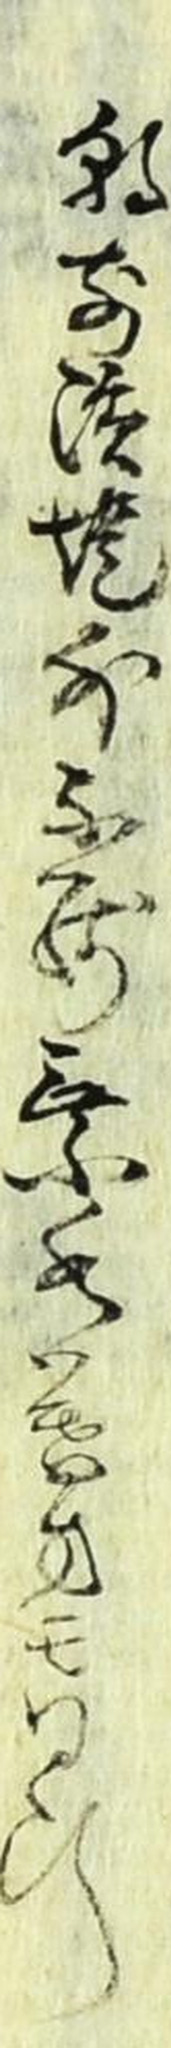朝前浜堤外不残乗水暮方モ同断
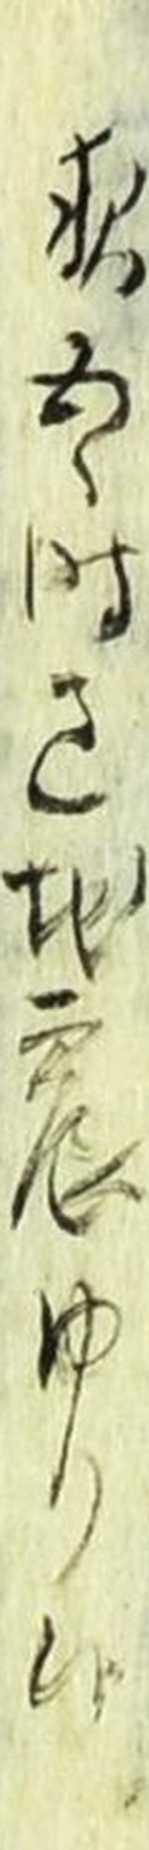夜五ツ時過地震ゆり候
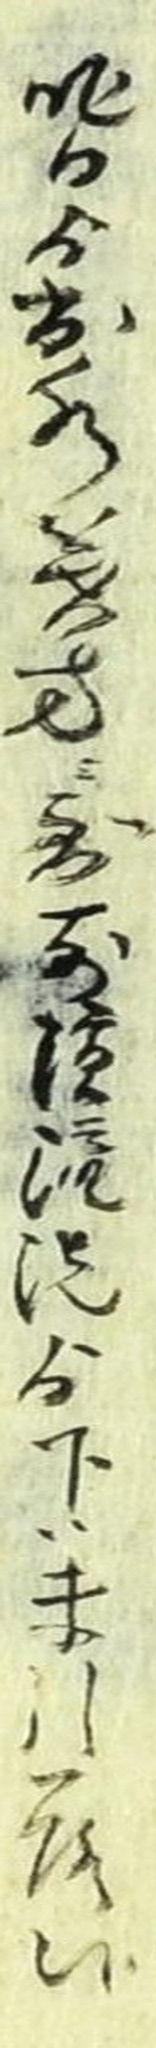昨日ゟ出水暮方ニ到前浜流洗ゟ下ハ未引落候
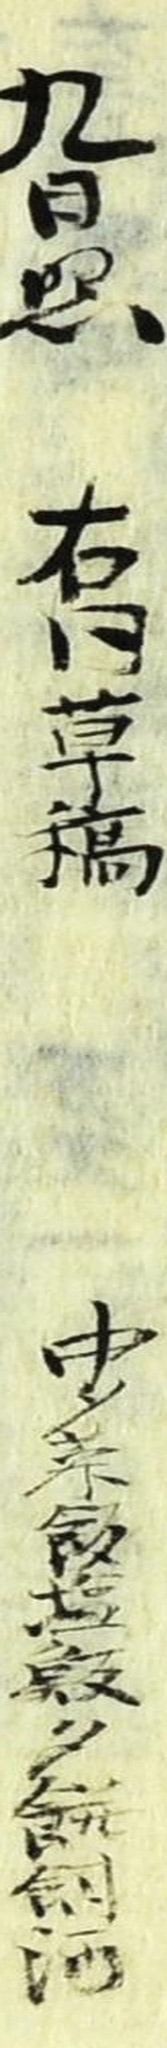九日照右同草稿中夕奈飯塩魬夕餅甘酒
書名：（日記）
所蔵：福井県文書館 Fukui Prefectural Archives
